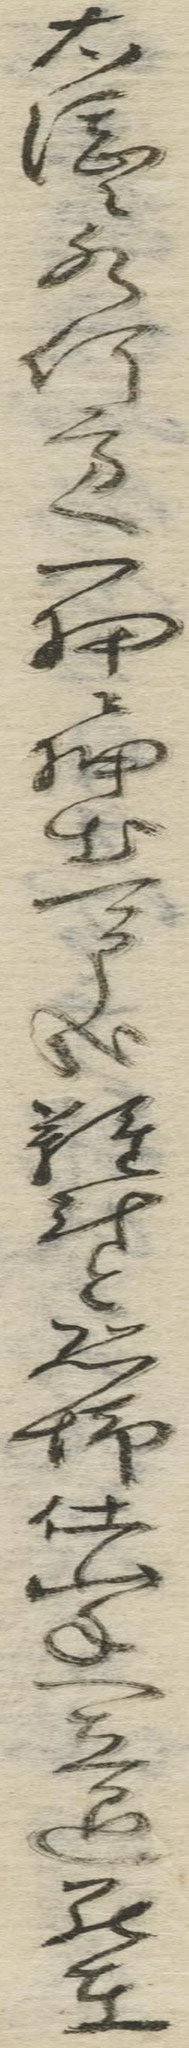右湛之水何方へ一押二押出可申哉難計と恐怖仕山手江立退罷在
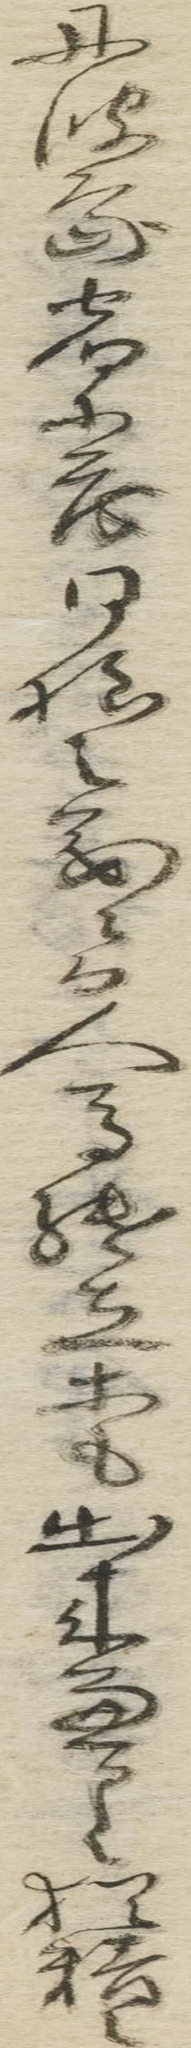丹波嶋宿にも同様之義二而人馬継立等も出来兼申候猶精々
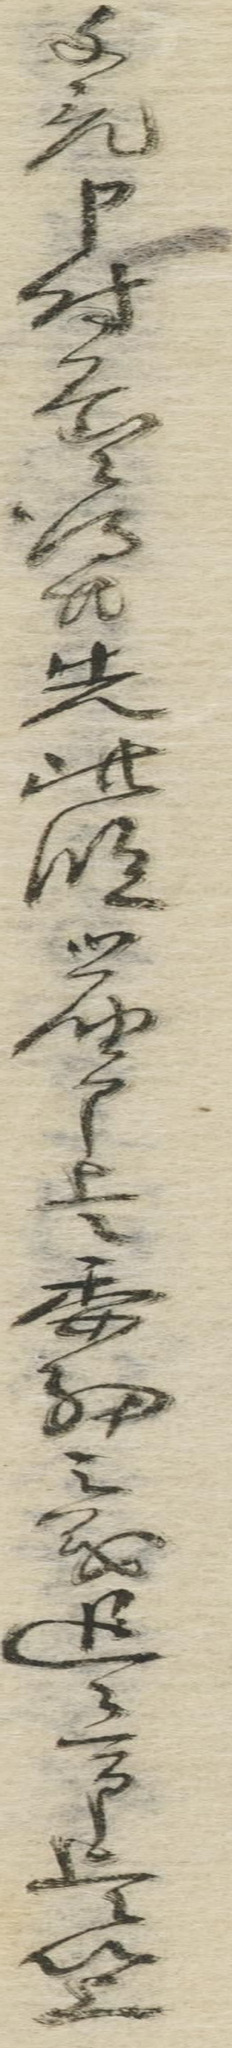手宛申付置候得共先此段御届申上候委細之義追々可申上候以上
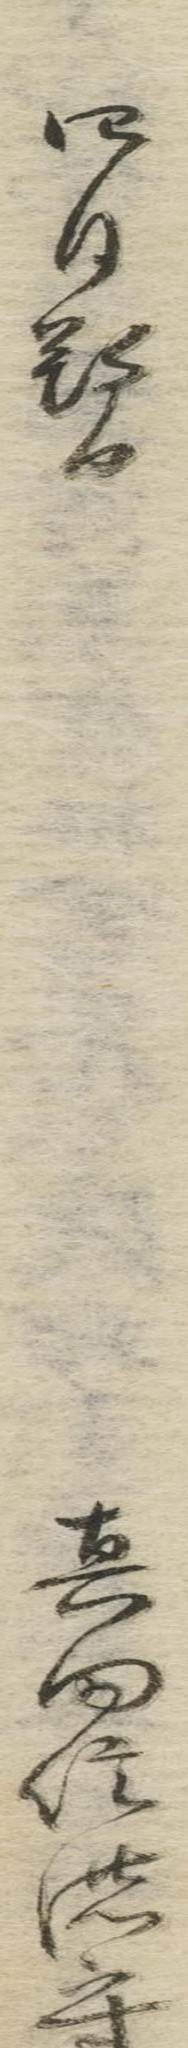未四月朔日真田信濃守
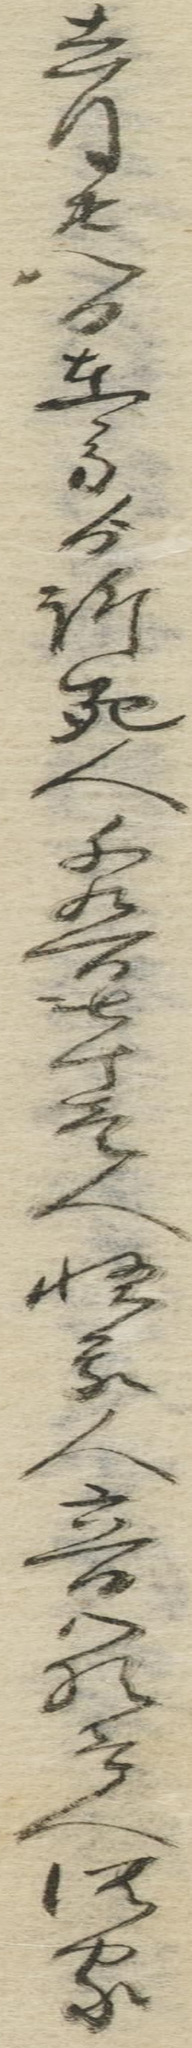去月廿八日在方ゟ訴死人千九百七十壱人怪我人六百八拾壱人潰家

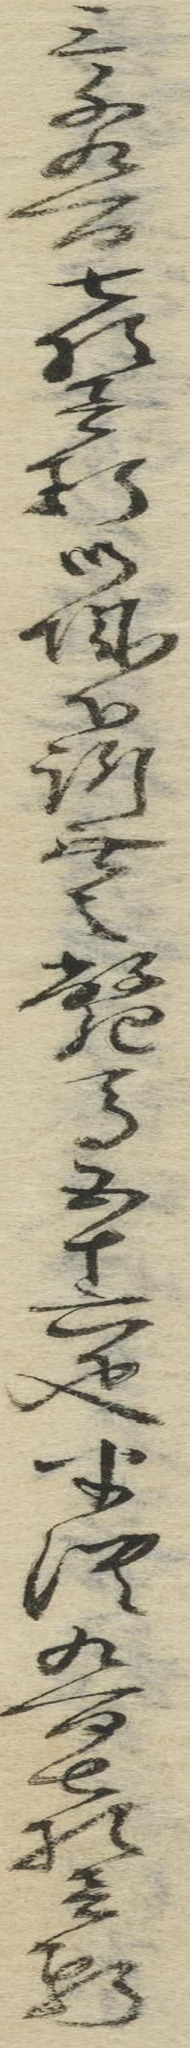三千九百七拾壱軒御城下訴無之弊馬五十六疋半潰九百七拾壱軒
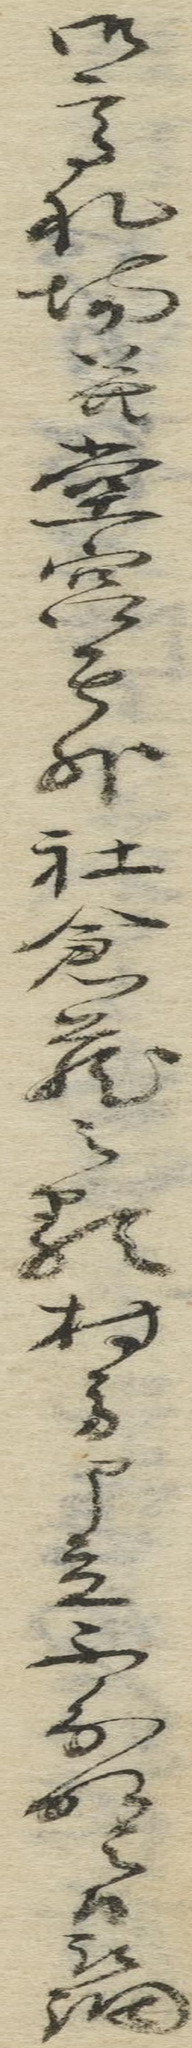御高札場并堂宮其外社倉蔵之類村方申立不分明二付取調
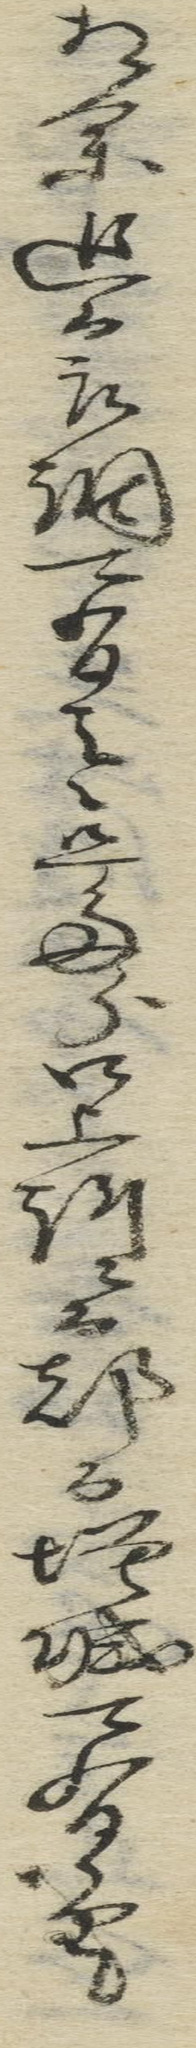相参追而取調可有之候且多分口上訴二而却而増減可有之御座候以上
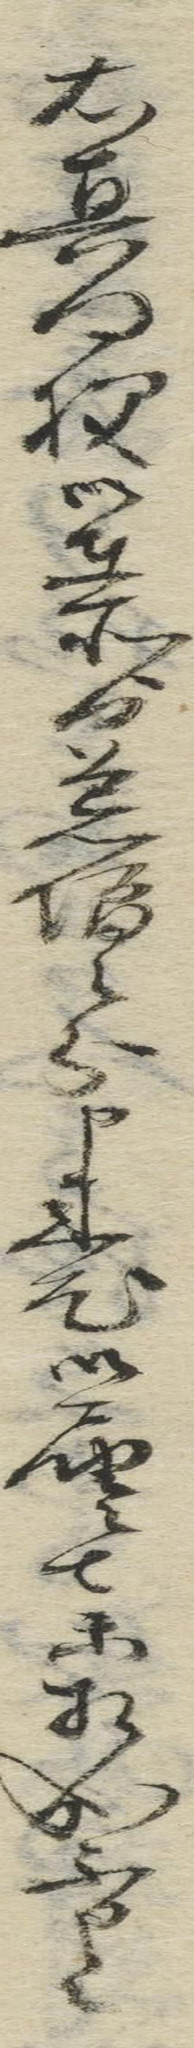右真田様御在所ゟ荒増之分申来尤御届は未相成不申候
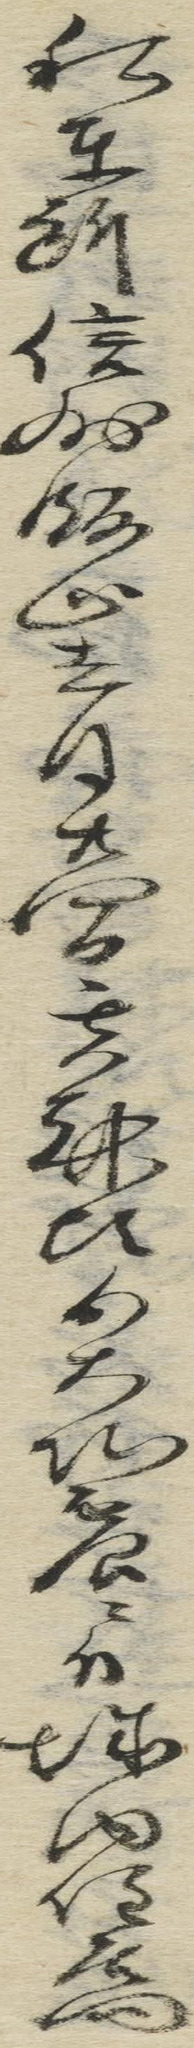私在所信州飯山去月廿四日亥刻比ゟ大地震二付城内住居向
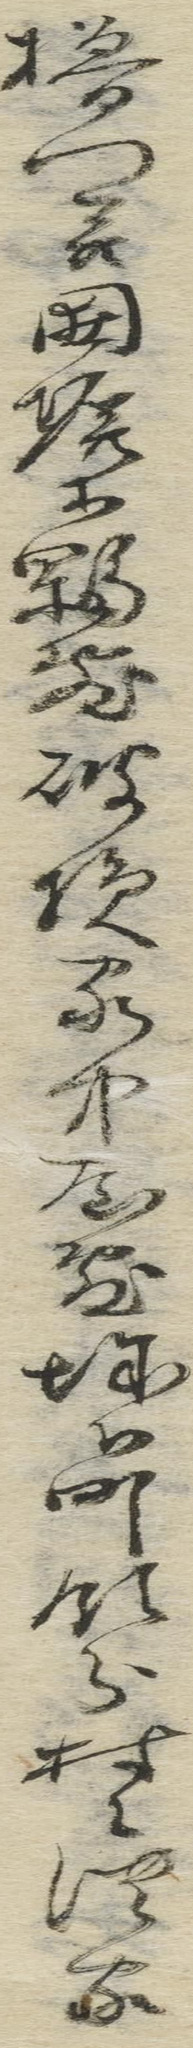櫓門并囲塀等夥敷破損家中屋敷城下町領分村々潰家
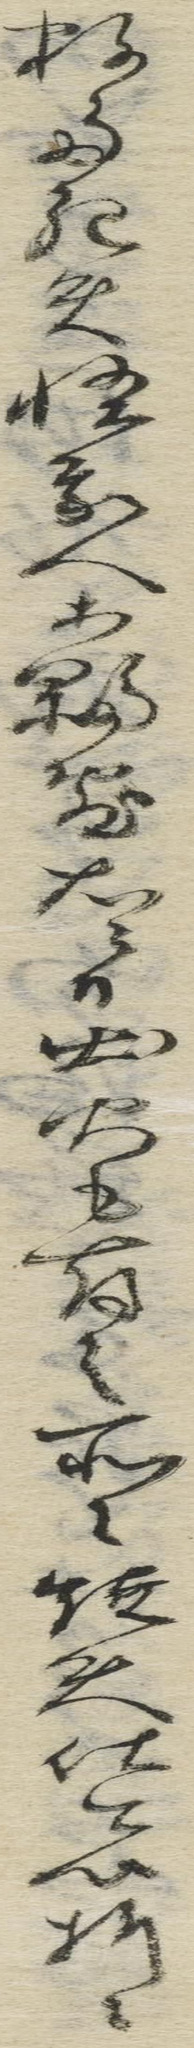数多死失怪我人等夥敷右二付出火も有之所々焼失仕今以折々
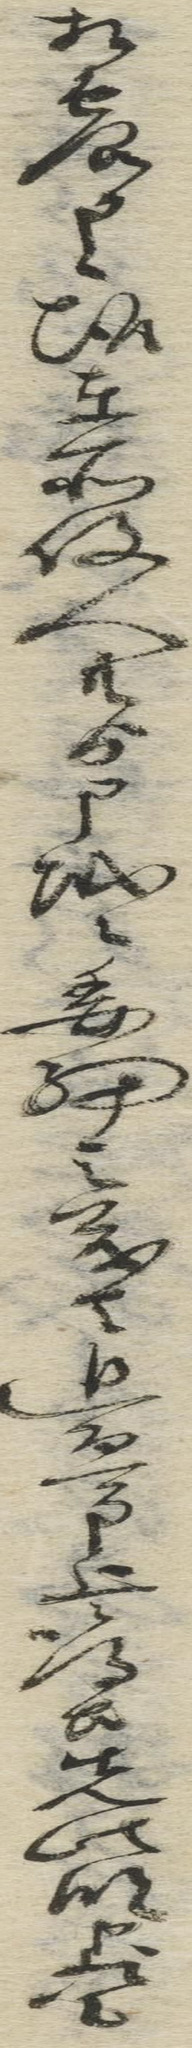相震申候趣在所役人共ゟ申越候委細之義は追而可申上候得共先此段申上候
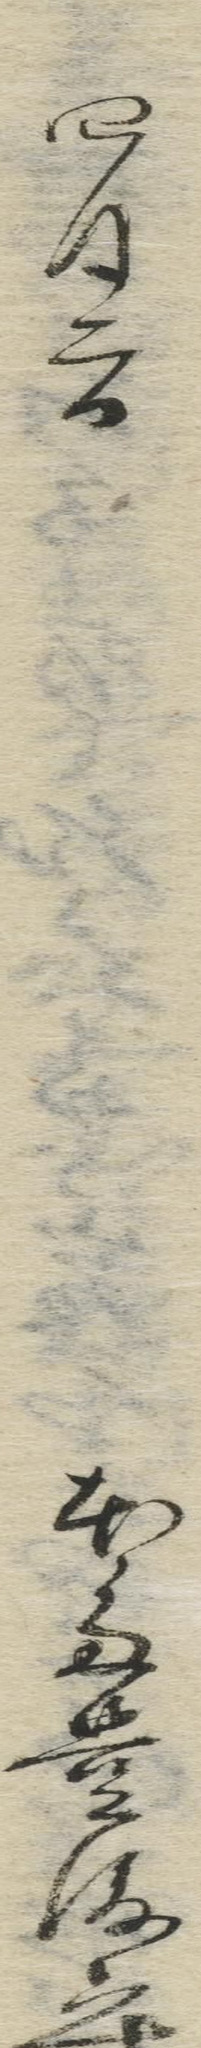四月二日本多豊後守
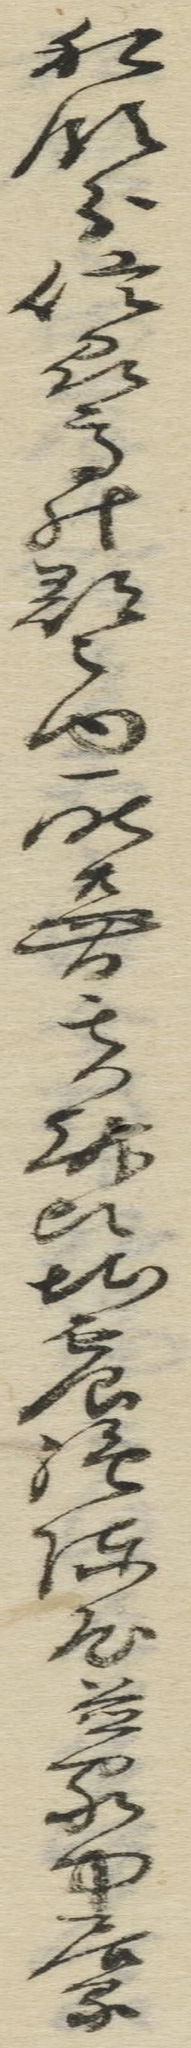私領分信州高井郡之内一昨廿四日亥刻比地震強陣屋并家中居家
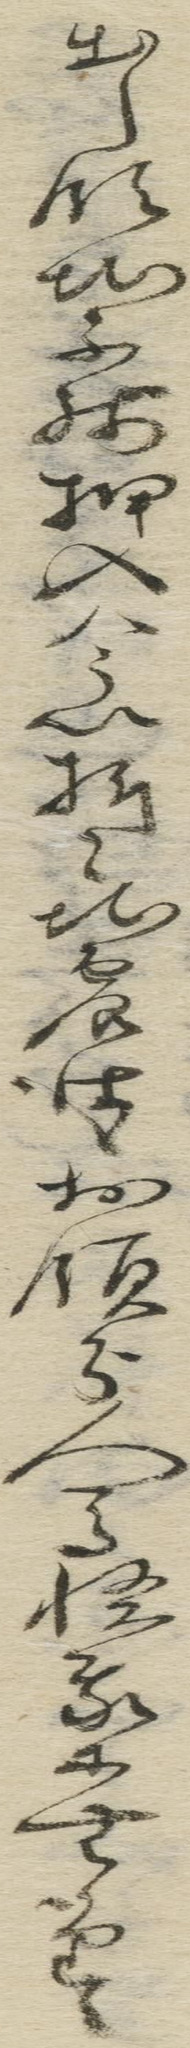出し領地不残押入今以折々地震仕候於領分人馬怪我等無御座候
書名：弘化丁未天變日記
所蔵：東京大学地震研究所図書室 Earthquake Research Institute Library, The University of Tokyo, JAPAN
